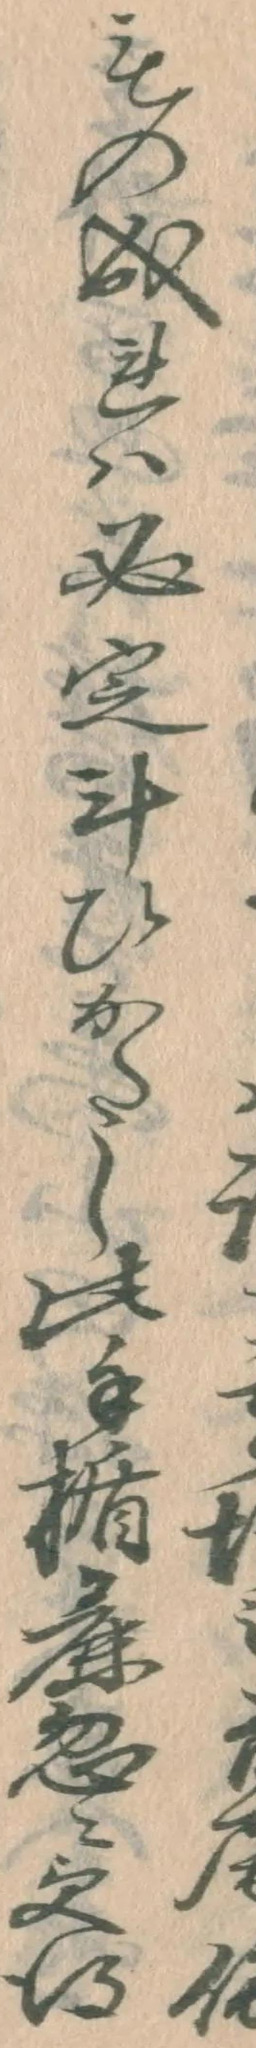もの成連は必定斗ひかたし此手楯廉忽に受得
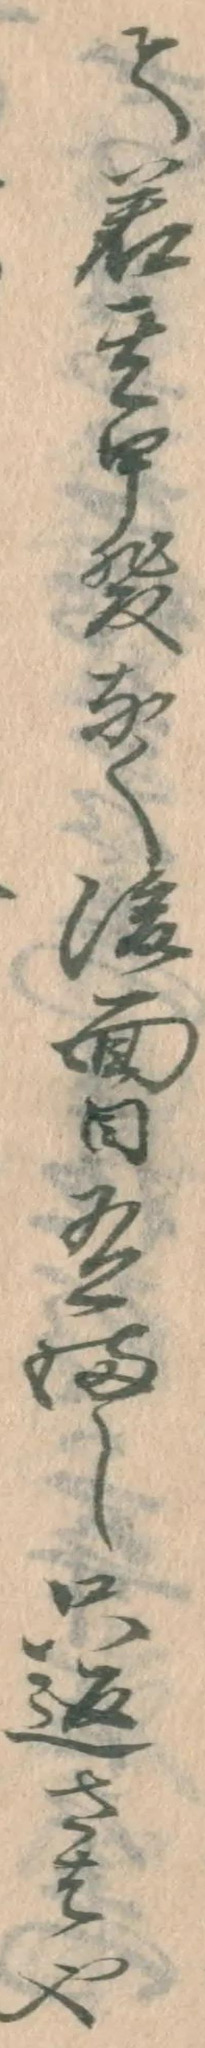て若其甲斐なく後面目有備し只返さはや
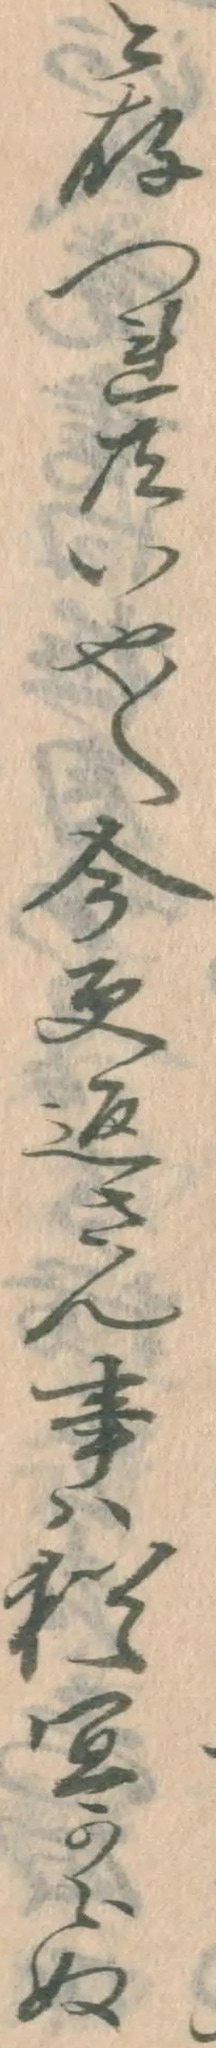と存つ連共いや〳〵今更返さん事は猶冝可らぬ
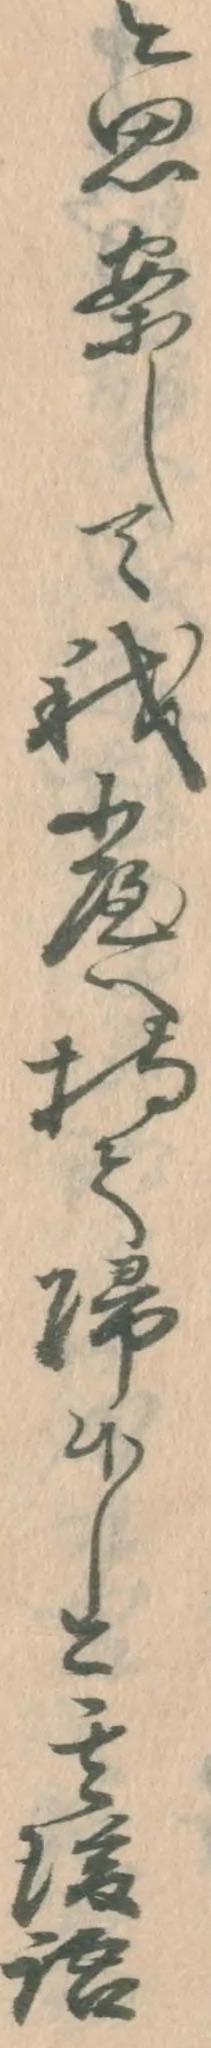と思案して我小屋へ持て帰本しと其後語

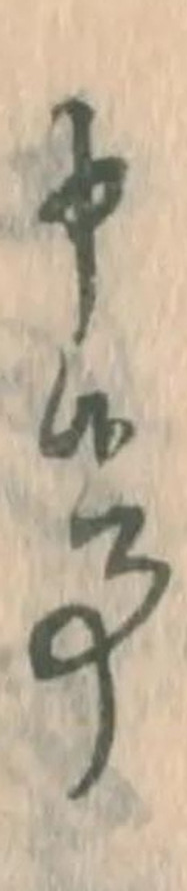申候事
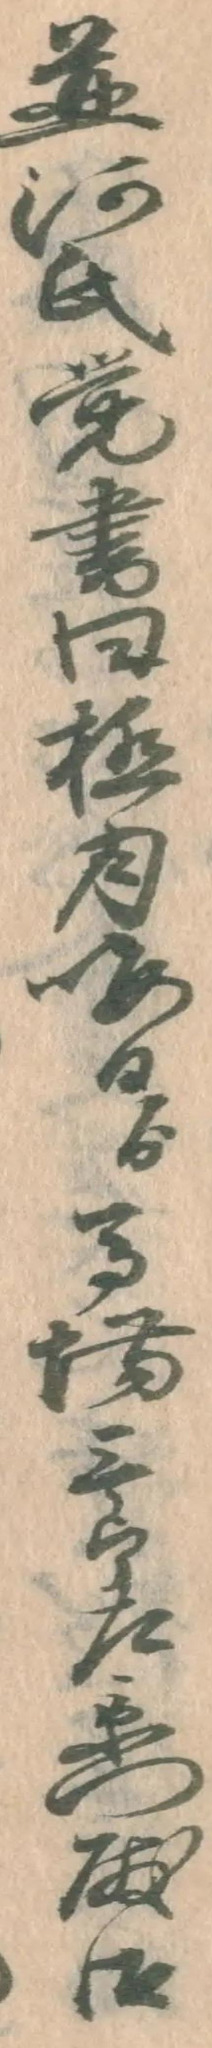並河氏覚書曰極月晦日ゟ馬場三郎左衛門殿御
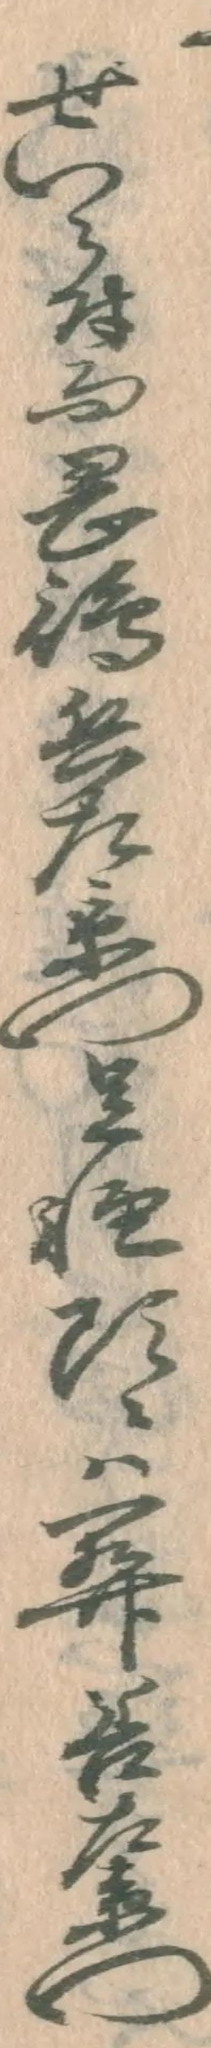せいに付而岡島兵左衛門足軽頭には関善左衛門
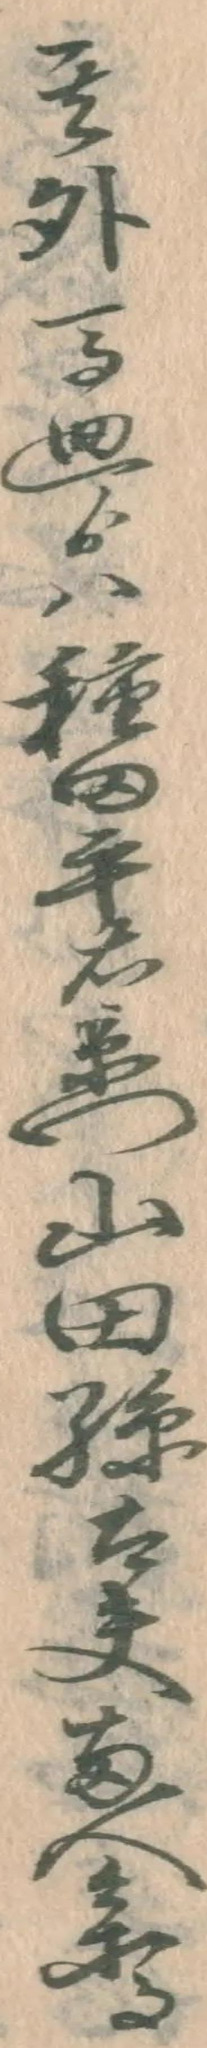其外馬廻ゟは種田平右衛門山田孫太夫両人参る
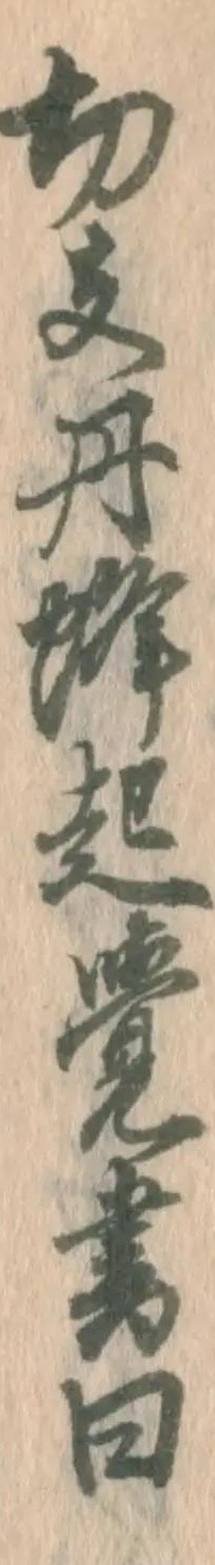切支丹蜂起覚書曰
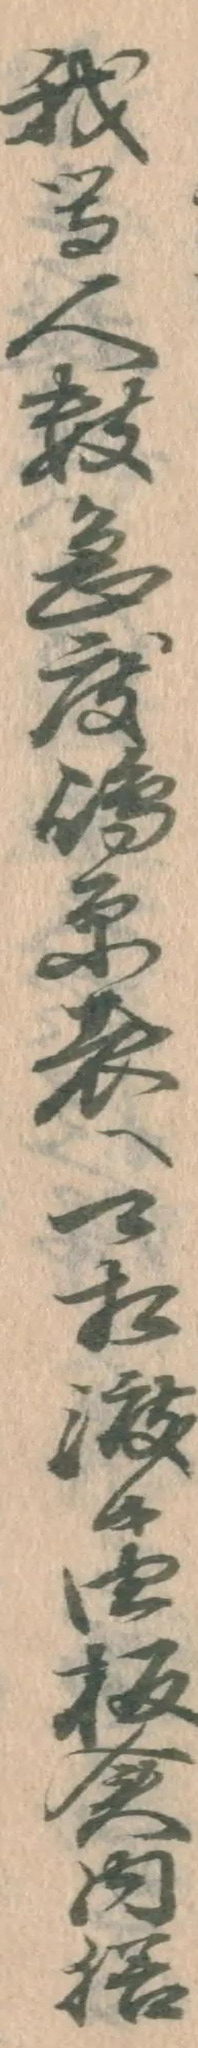我等人数急度島原表へ可相渡候由板倉内膳
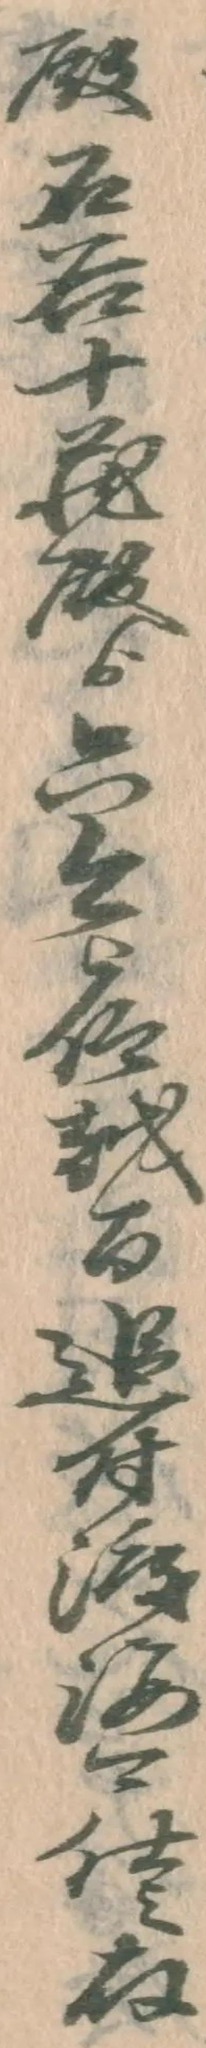殿石谷十蔵殿ゟ只今被仰越間追付渡海可仕与存
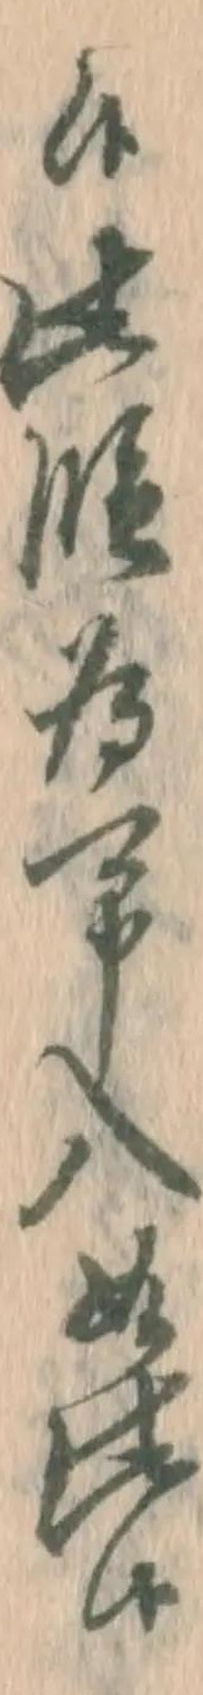候此段為可申入如此候
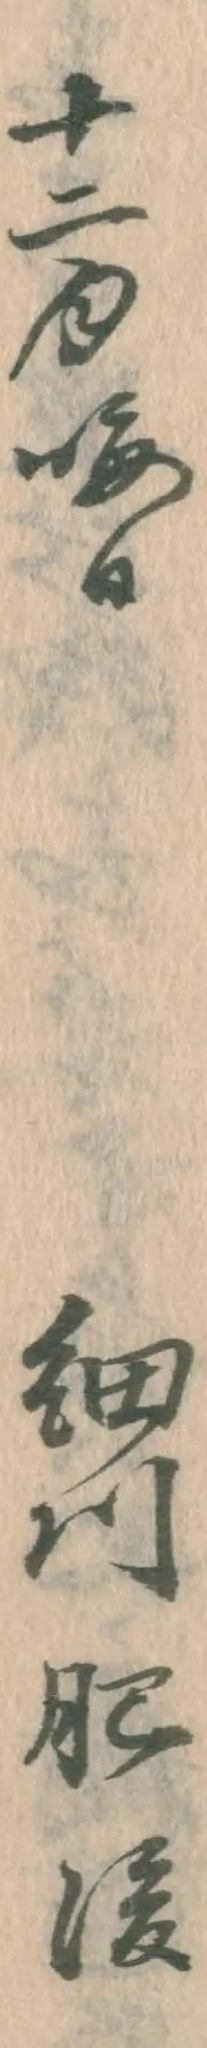十二月晦日細川肥後
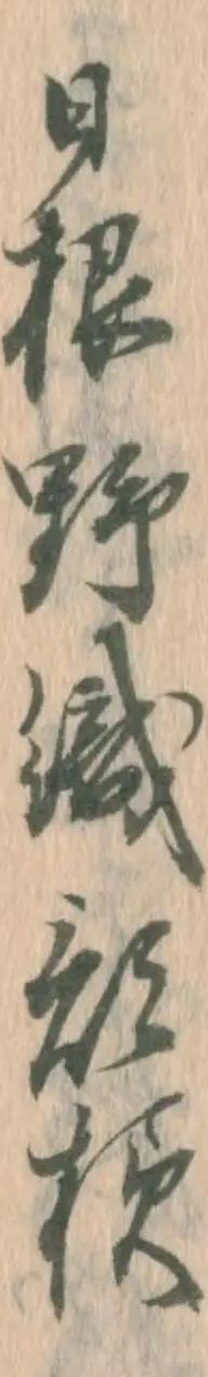日根野織部頭様
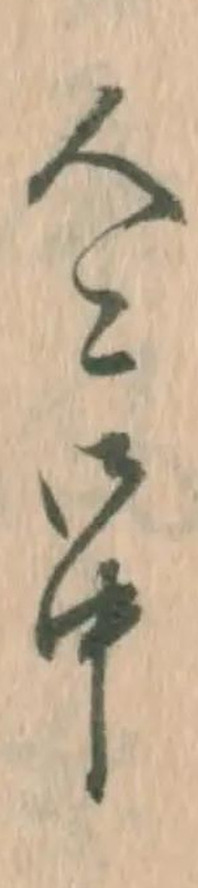人々御中
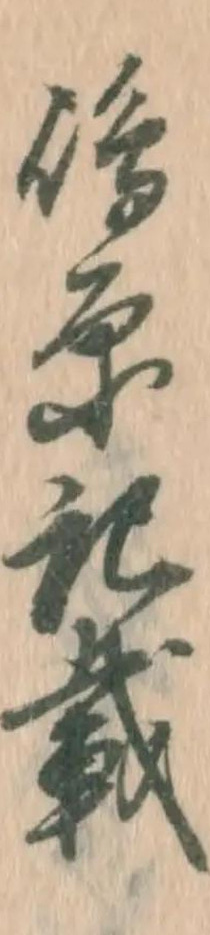島原記載
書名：切支丹御退治記 49巻. [5]
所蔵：国立国会図書館 National Diet Library, JAPAN
